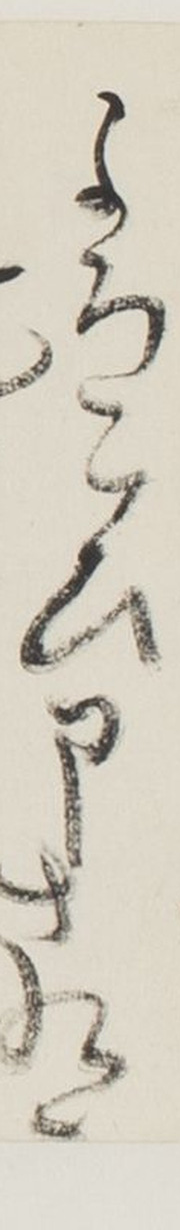よろこひ申され候
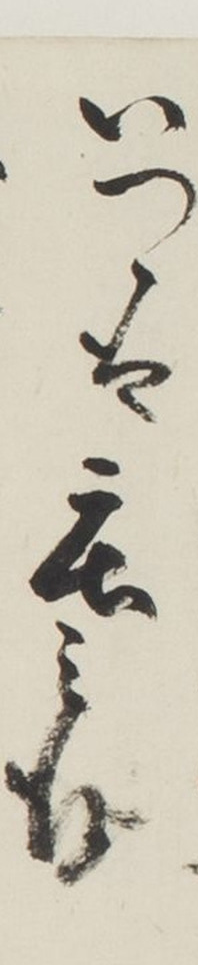いつゝや庄兵衛
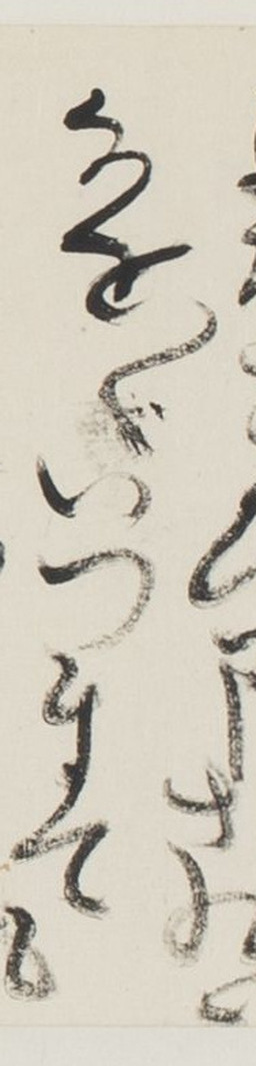なを〳〵いつまても
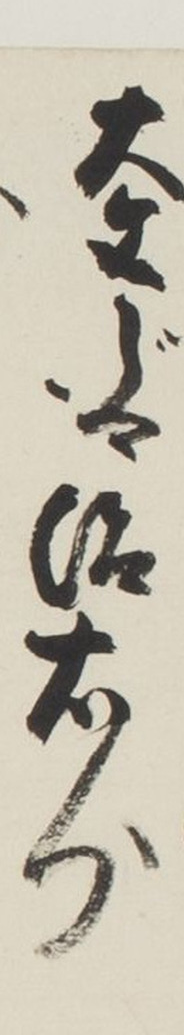大文じや治右衛門
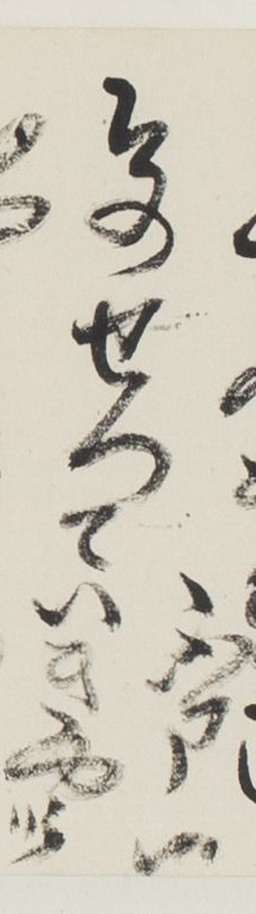そのせつていきやうが
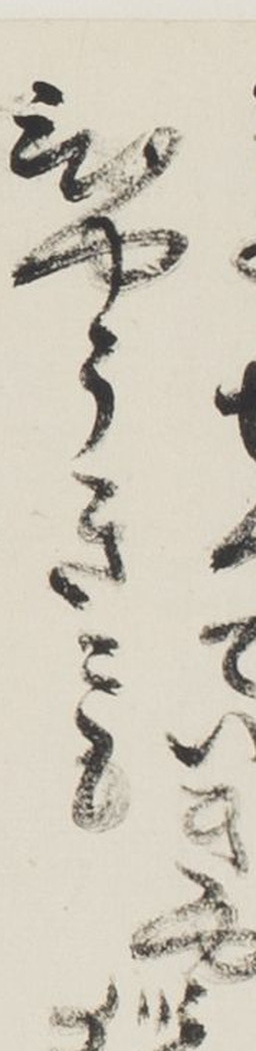ひやうきにも
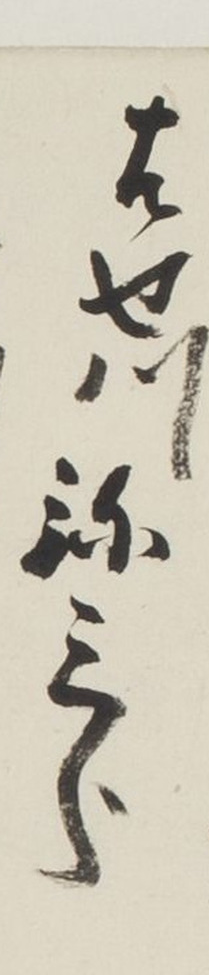はせ川弥三郎
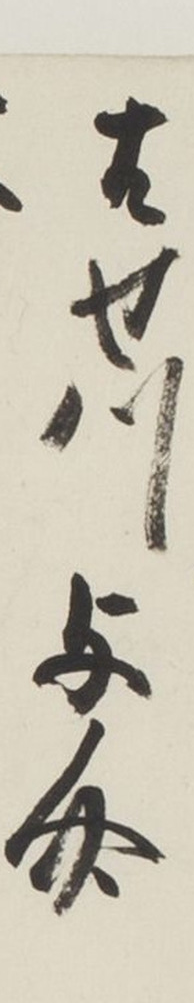はせ川与介
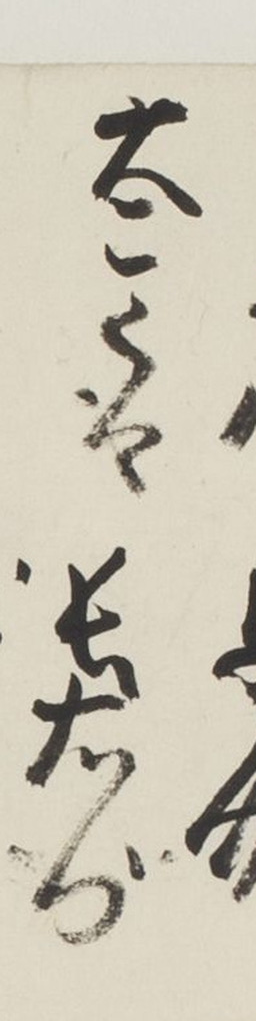大こくや長右衛門
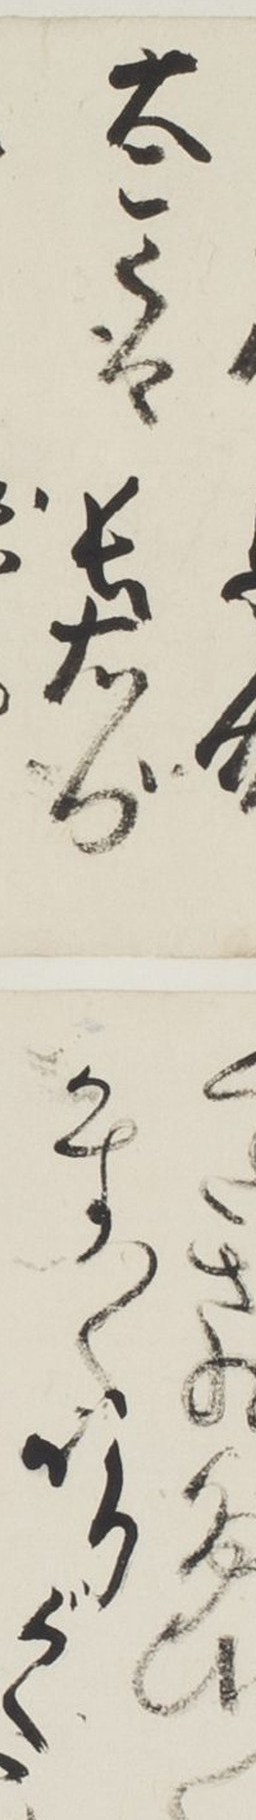大こくや長右衛門
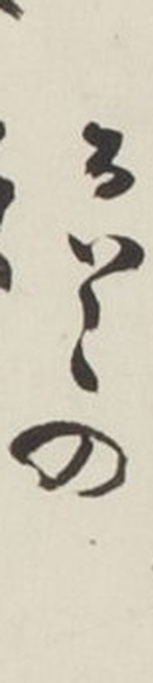おいこの
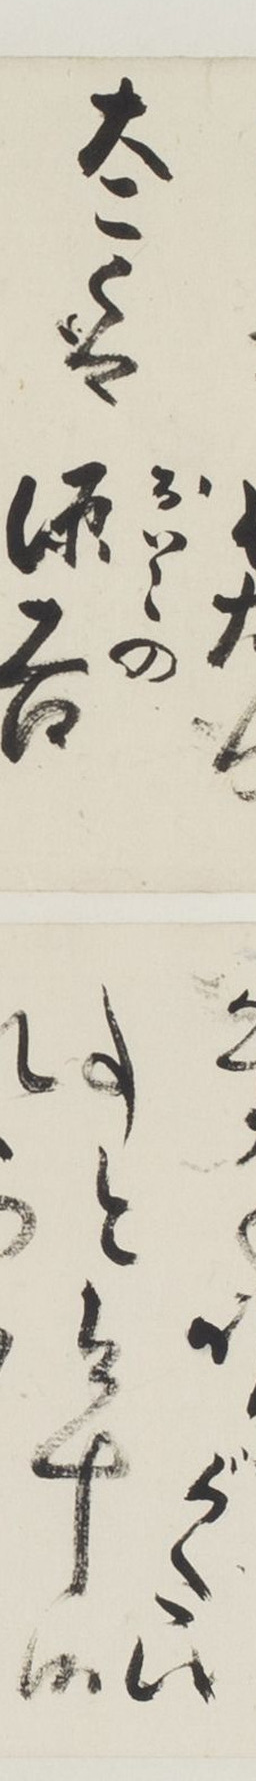大こくや源吉
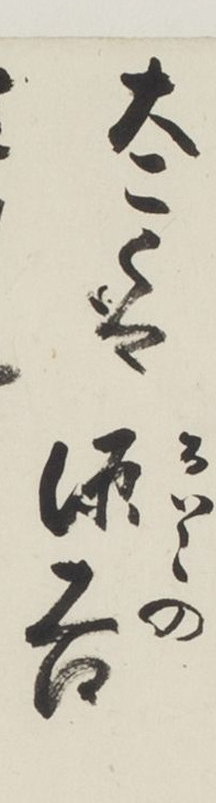大こくや源吉
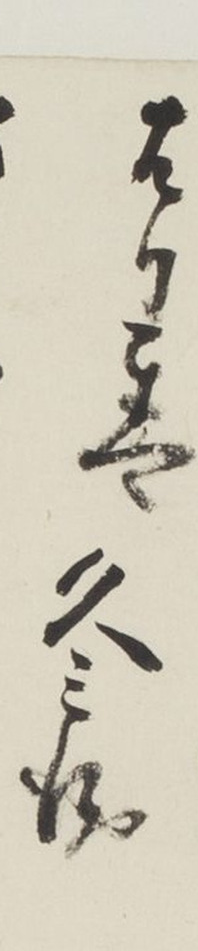はりまや久兵衛
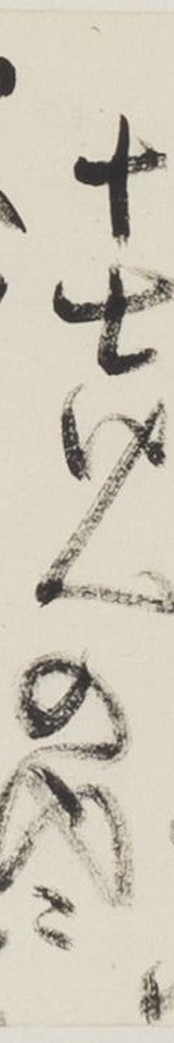十七けんの内にて
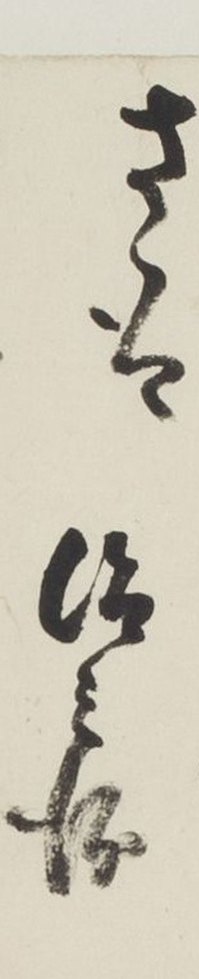さゝや治兵衛
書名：京洛中大焼節届の次第
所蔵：あいおいニッセイ同和損保株式会社
